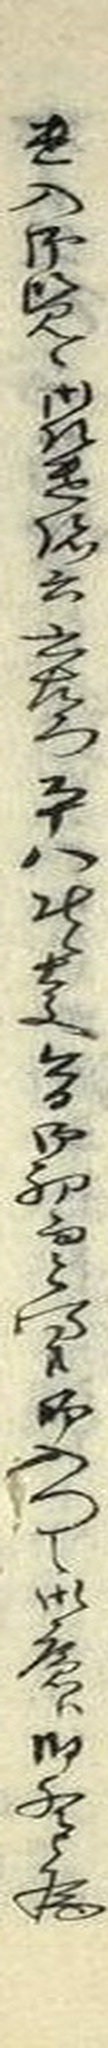遣入御覧候御次遣弥六六左衛門平八次郎太夫今日御初而ニ候得共御入門之御廉ハ御冬被為
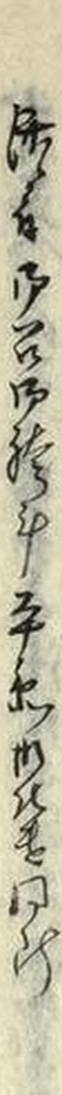済候ニ付御召御袴斗平兵衛御次遣同断
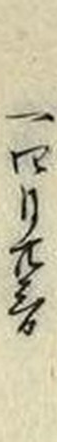一四月廿三日
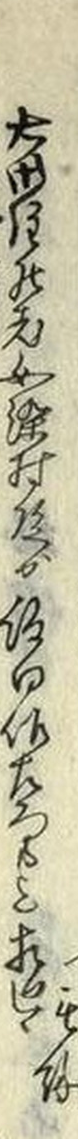右御住居老女染村殿ゟ飯田作左衛門方迄相廻候
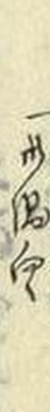御側向へ
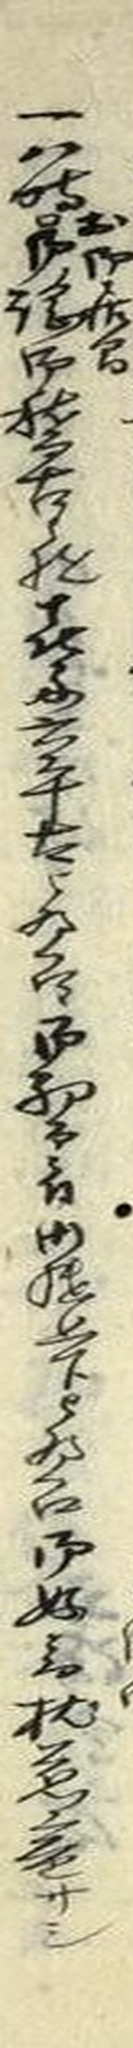一八時於御居間御謡御稽古被遊喜多六平太被為召候御初而ニ付御継上下被為召御好ニ而枕慈童サシ

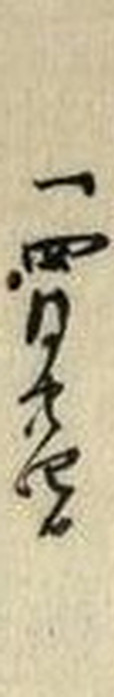一四月廿九日
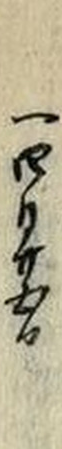一四月廿九日
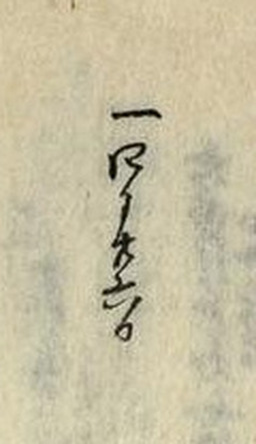一四月廿九日
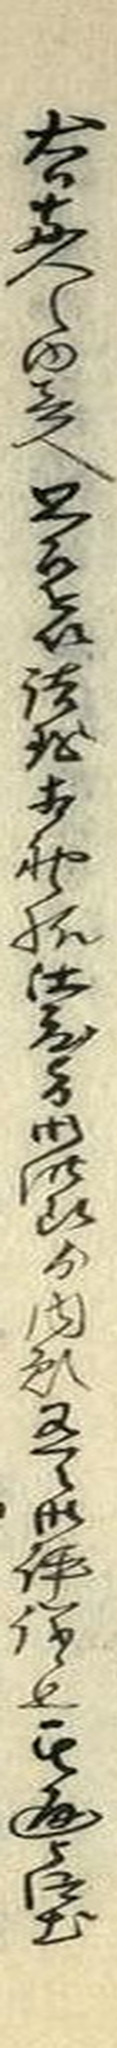右ハ両人之内壱人思召を以詰越相勤候様仕度旨御供頭ゟ内願有之御評議之上其通被仰出
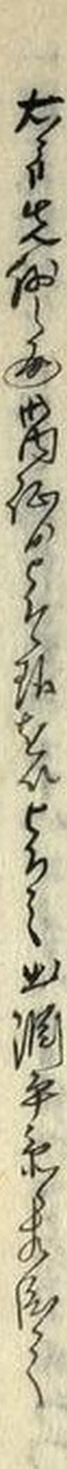右ニ付先例之通御内証ゟ被下候趣を以被下之出淵平兵衛へ相渡之
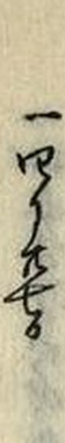一四月廿九日
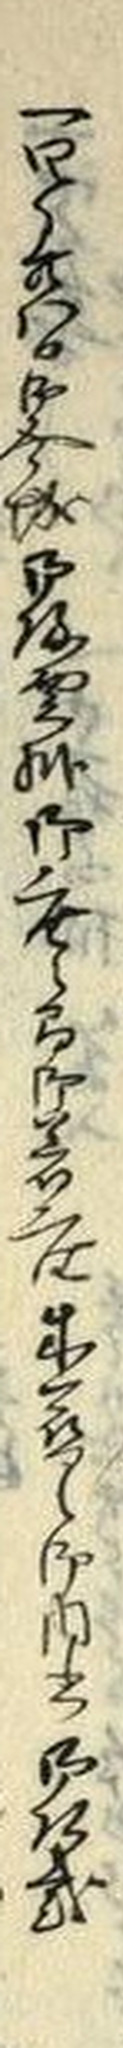一四月廿八日御登城御帰殿掛御座之間御着座歳暮之御内書御頂戴
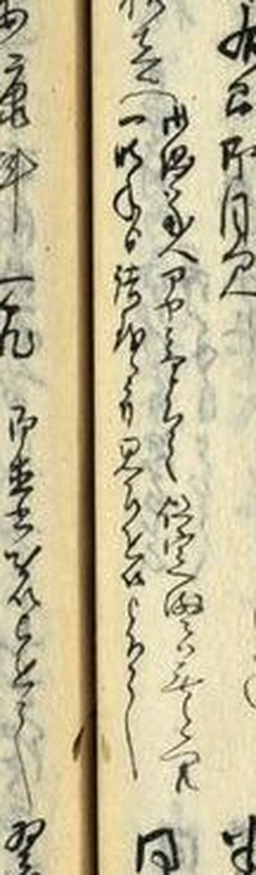一昨年ゟ詰越候ニ付思召を以被下之同人
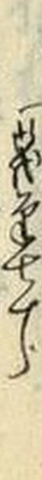御代筆七十郎
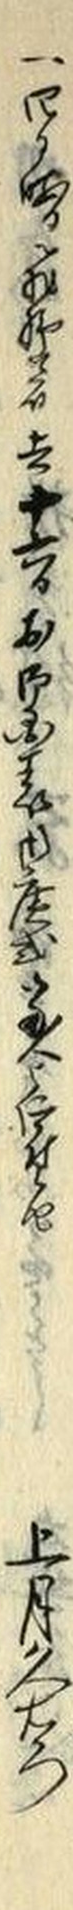一四月晦日飛脚着去十六日於御国表御広式御用人被仰付候由上月久右衛門
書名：少傅日録抄（斉善付側向頭取日記、在府）
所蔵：福井県文書館 Fukui Prefectural Archives
